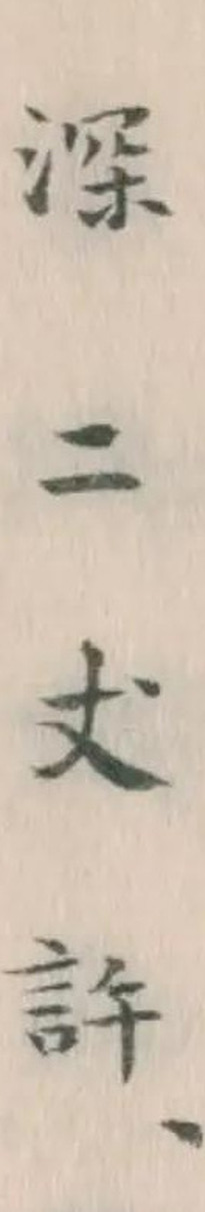深二丈許、
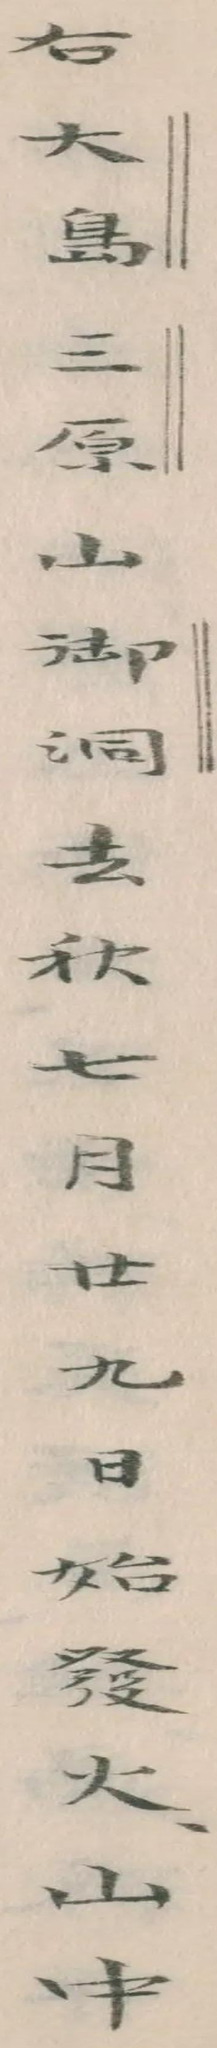右大島三原山御洞去秋七月廿九日始発火、山中
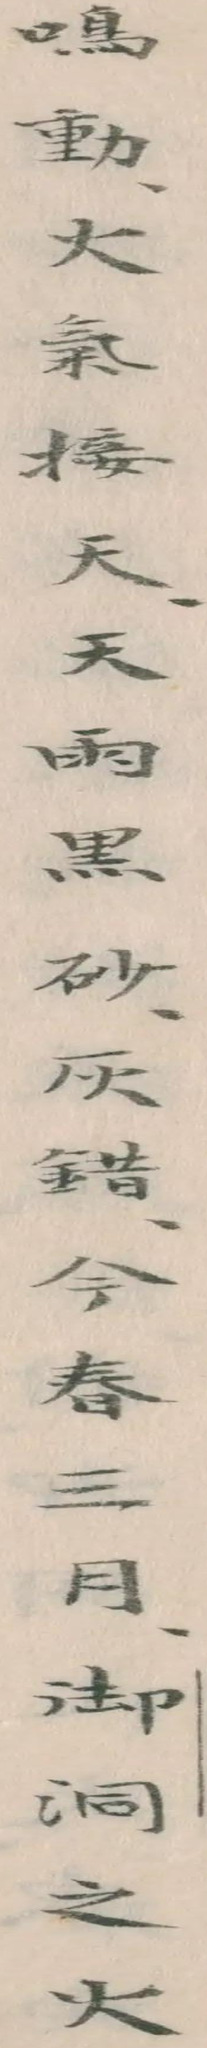鳴動、火気接天、天雨黒砂、灰錯、今春三月、御洞之火
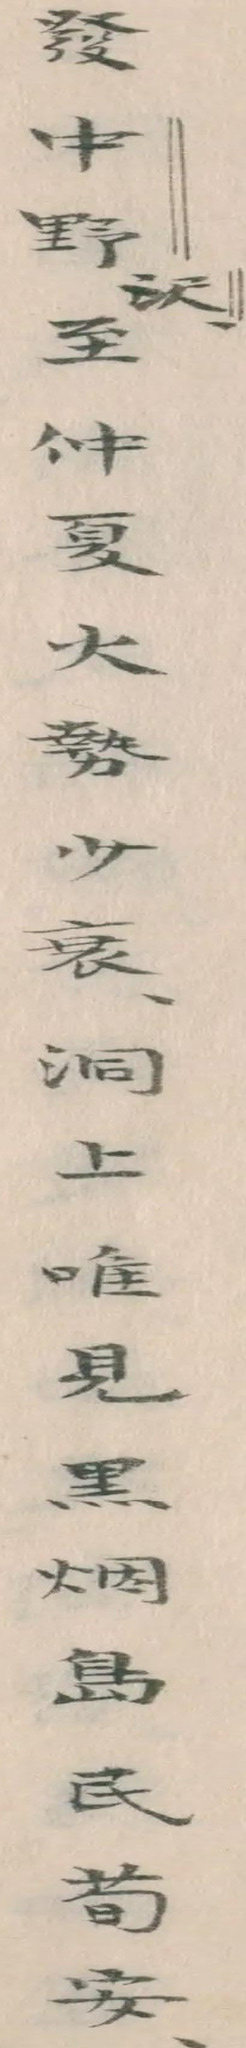発中野沢、至仲夏火勢少衰、洞上唯見黒烟島民荀安、
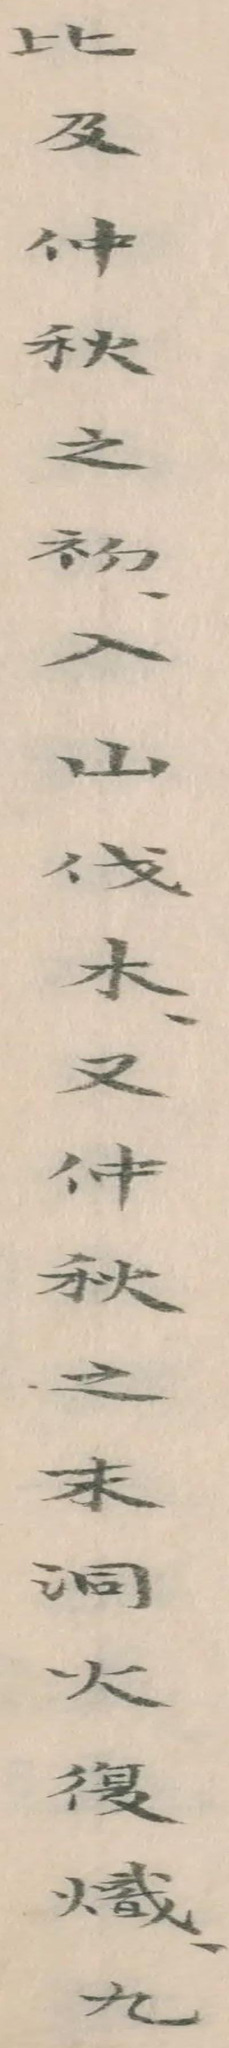比及仲秋之初、入山伐木、又仲秋之末洞火復熾、九

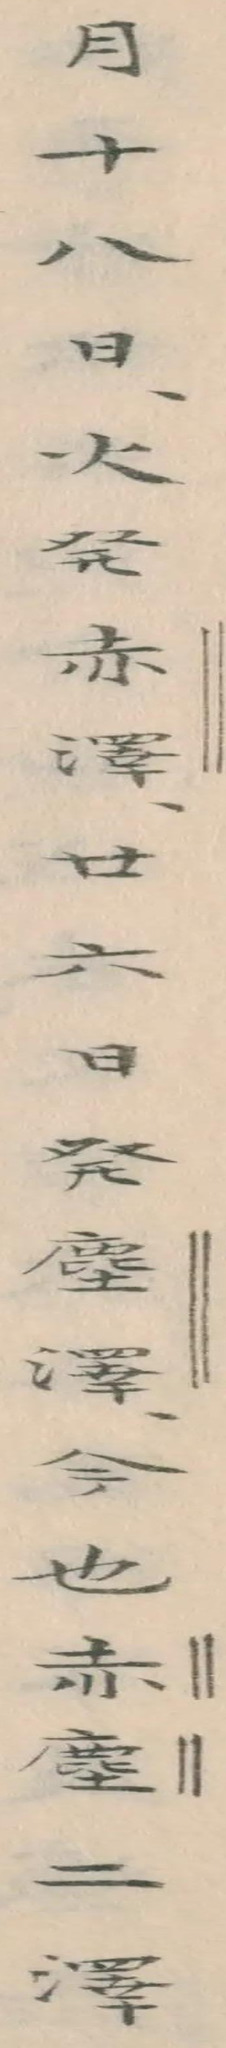月十八日、火発赤沢、廿六日発塵沢、今也赤塵二沢
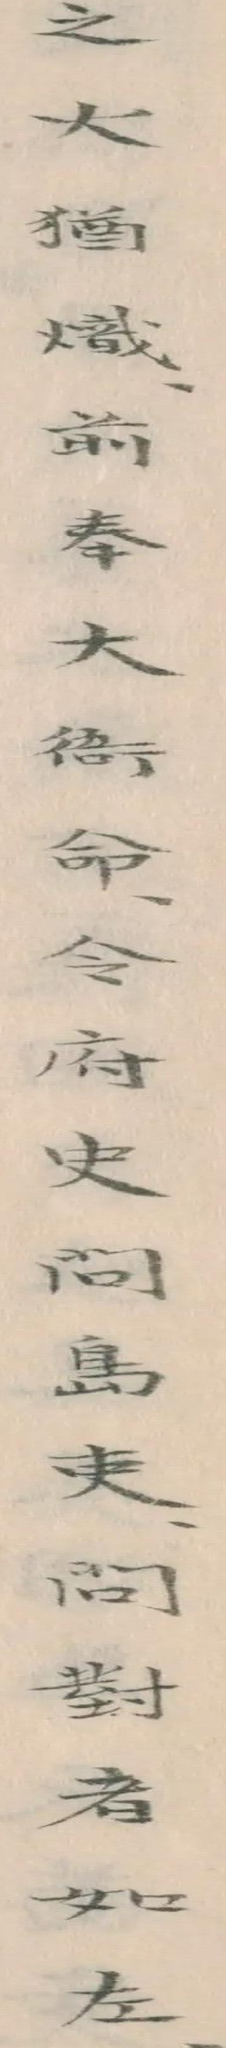之火猶熾、前奉大衙命、令府史問島吏、問対者如左、
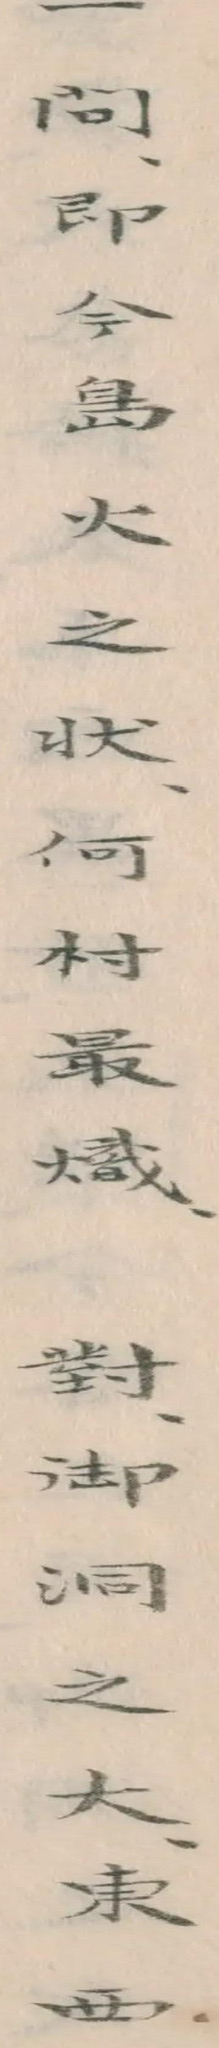一問、即今島火之状、何村最熾、対、御洞之大、東西
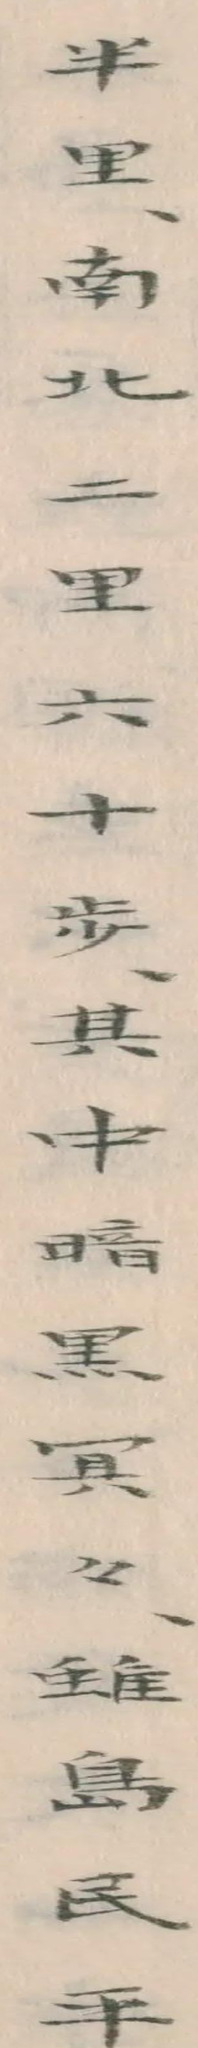半里、南北二里六十歩、其中暗黒冥々、雖島民平
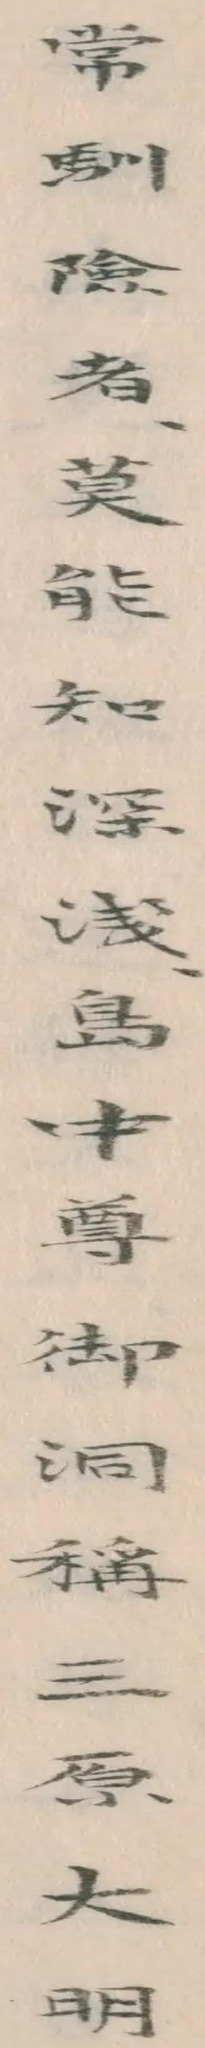常馴険者、莫能知深浅、島中尊御洞称三原大明
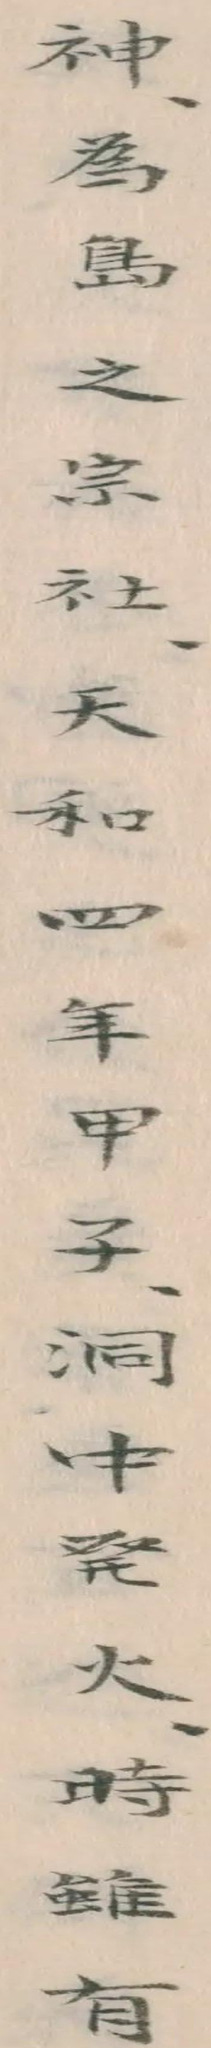神、為島之宗社、天和四年甲子、洞中発火、時雖有
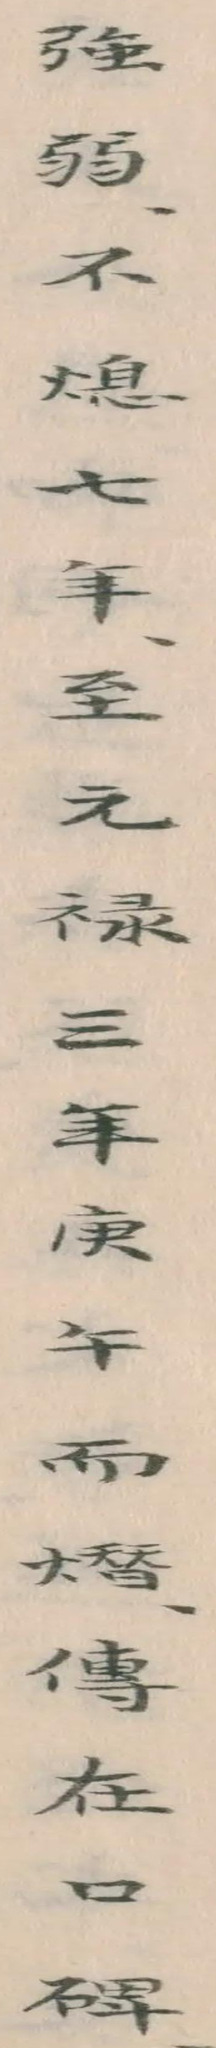強弱、不熄七年、至元禄三年庚午而熸、伝在口碑、
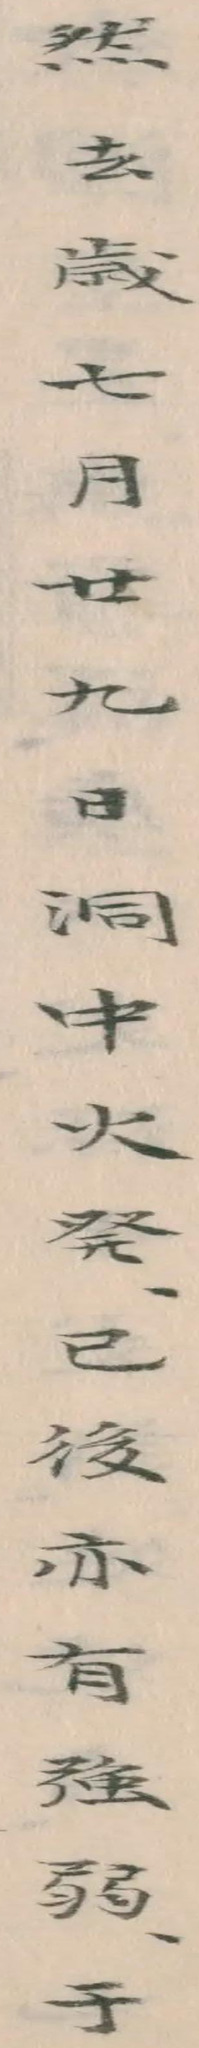然去歳七月廿九日洞中火発、已後亦有強弱、于
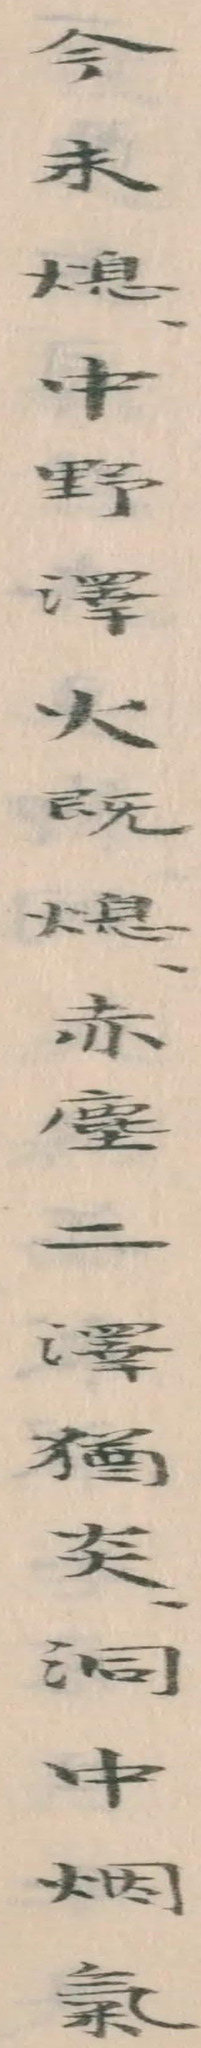今未熄、中野沢火既熄、赤塵二沢猶炎、洞中烟気
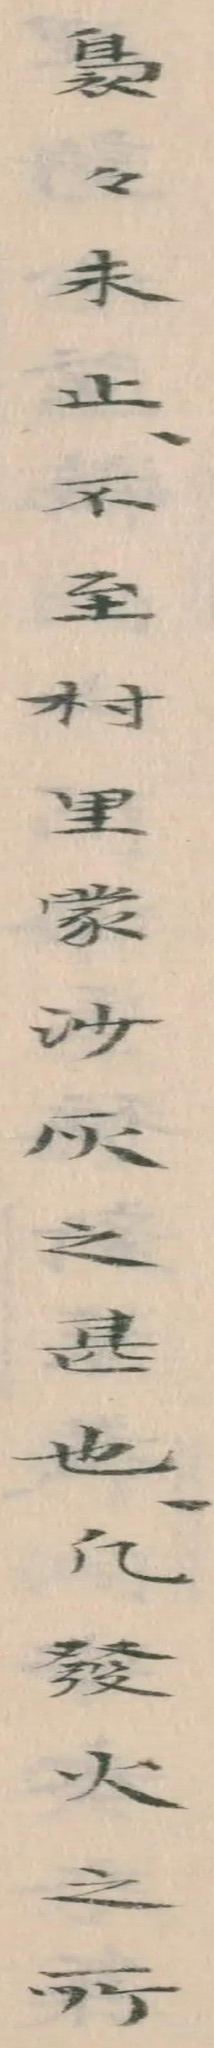裊々未止、不至村里沙灰之甚也、凡発火之所
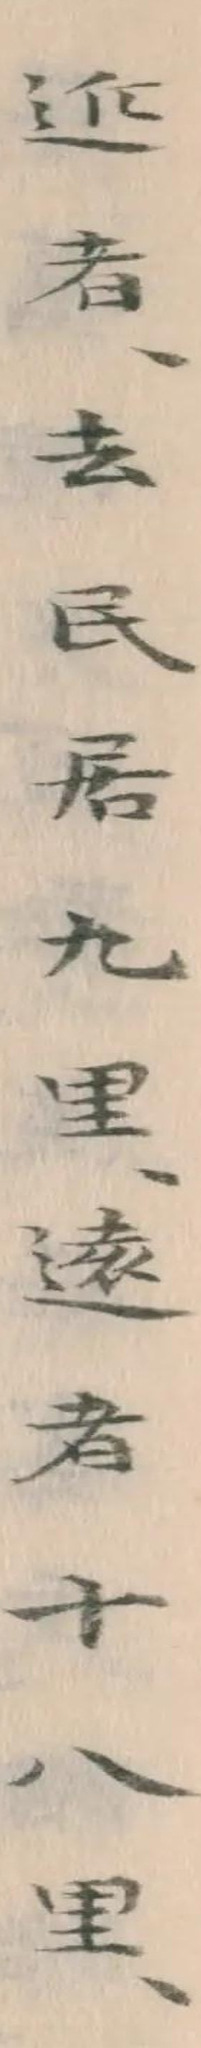近者、去民居九里、遠者十八里、
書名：地災撮要. 巻11-12(地震之部)
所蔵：国立国会図書館 National Diet Library, JAPAN
